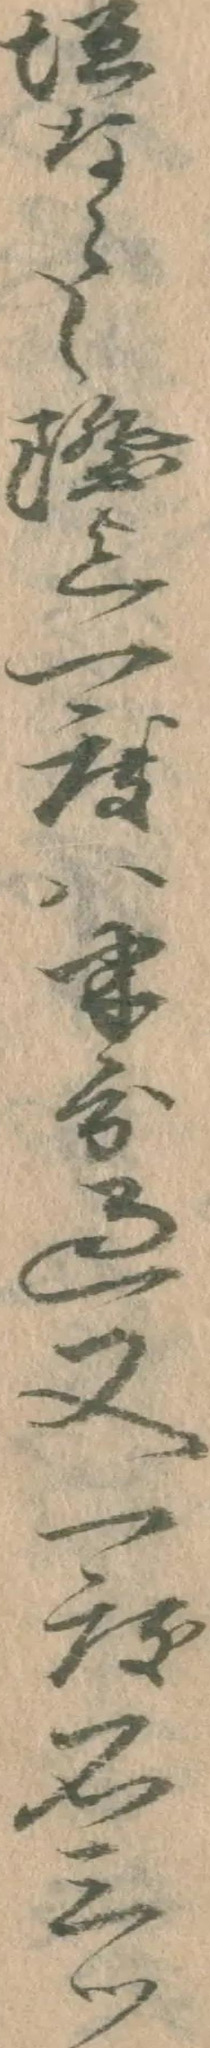垣ならし際迄一度は半分過又一度石三つ
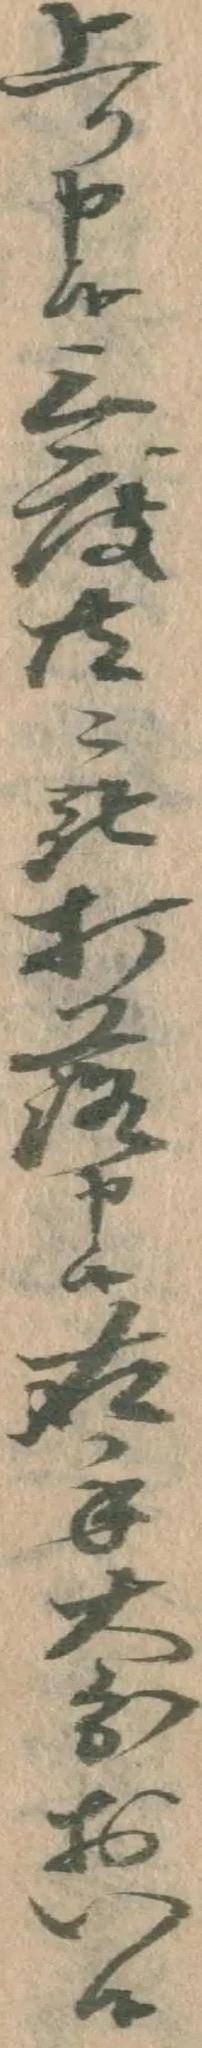上り申候三度共に被打落申候右手大分おい候
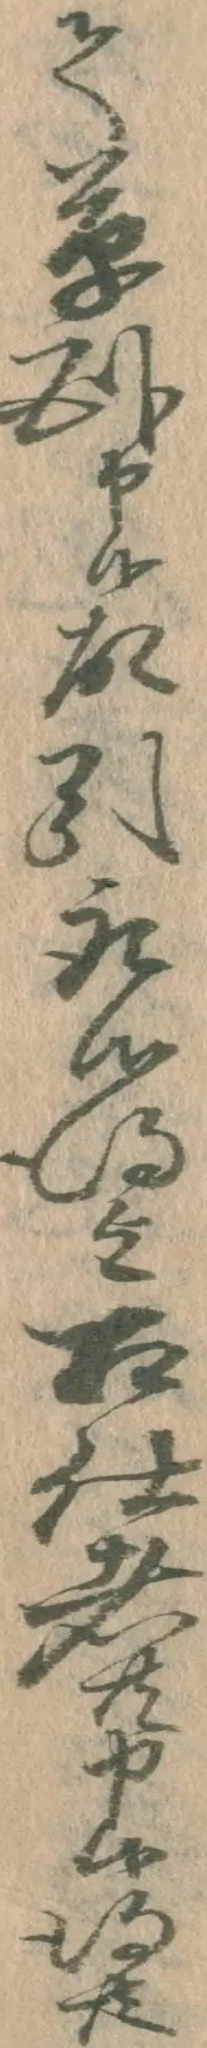て草臥申候故引取候得与召仕者共申候得共
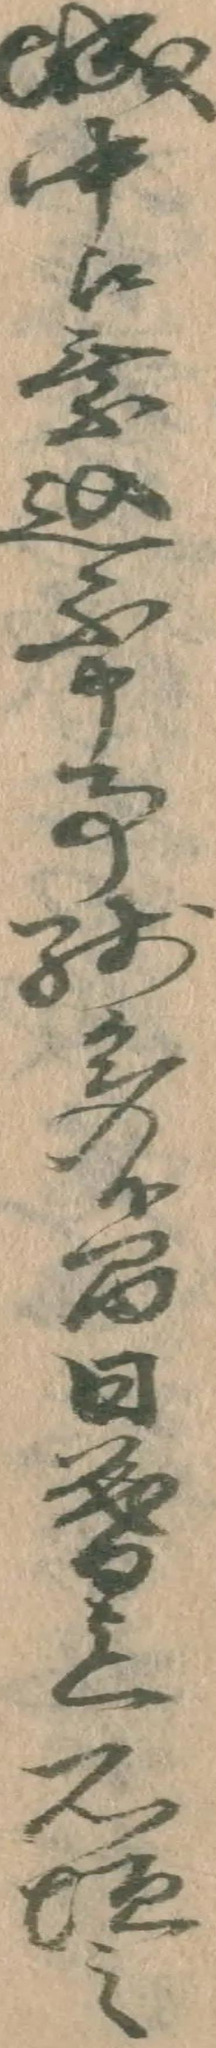城中江乗込ふ申事残多候間日暮迄石垣之
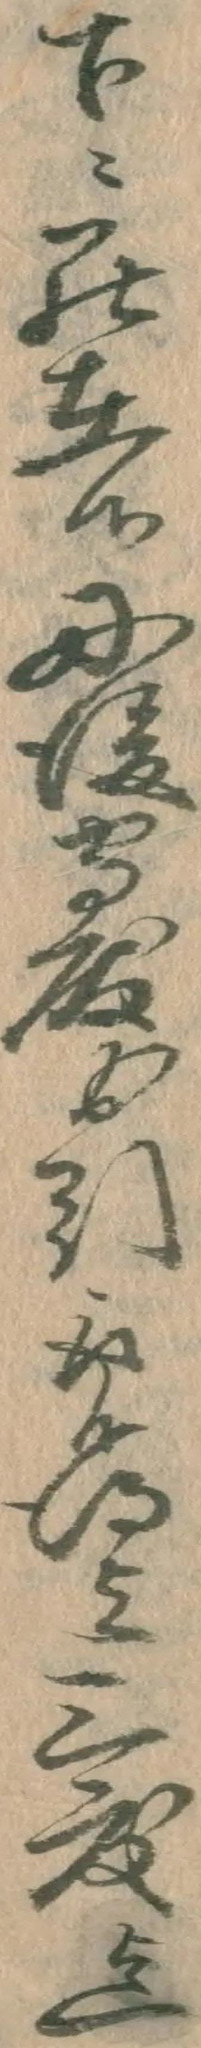下に罷在候丹後守殿ゟ引取候得与三度迄
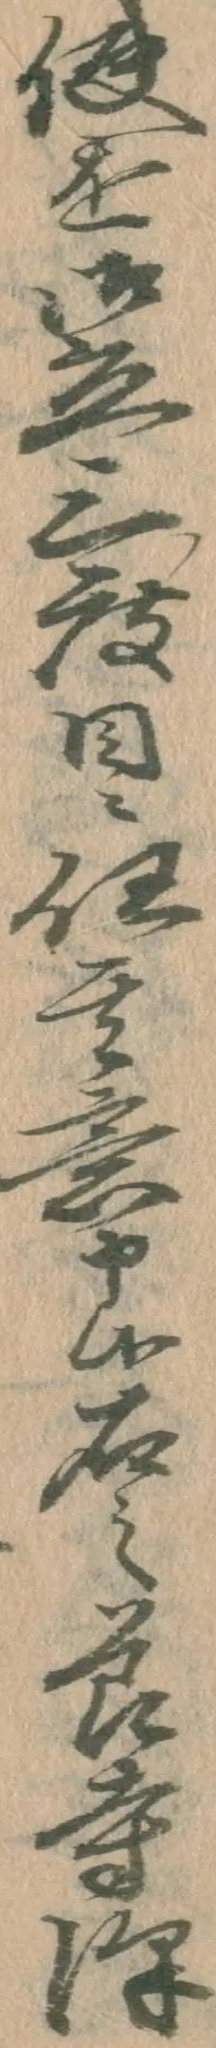使を御立三度目に任其意申候右之節寺沢
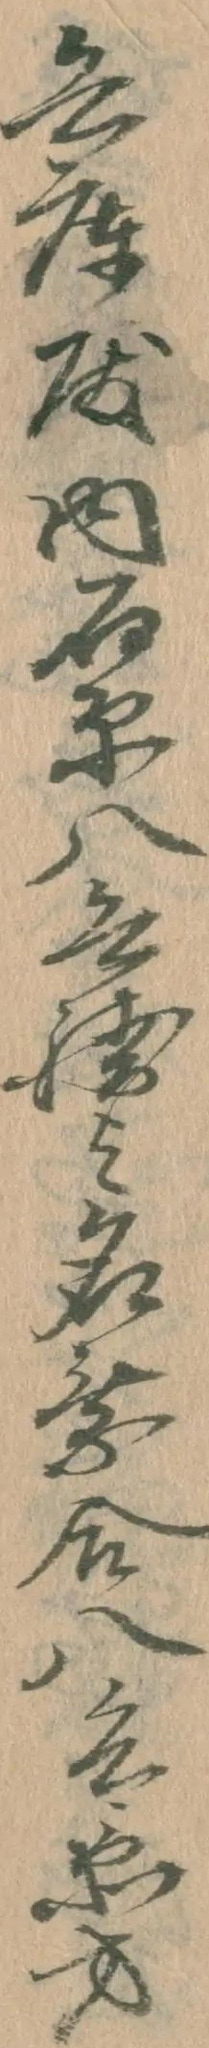兵庫殿内石原八兵衛与名乗合八兵衛方
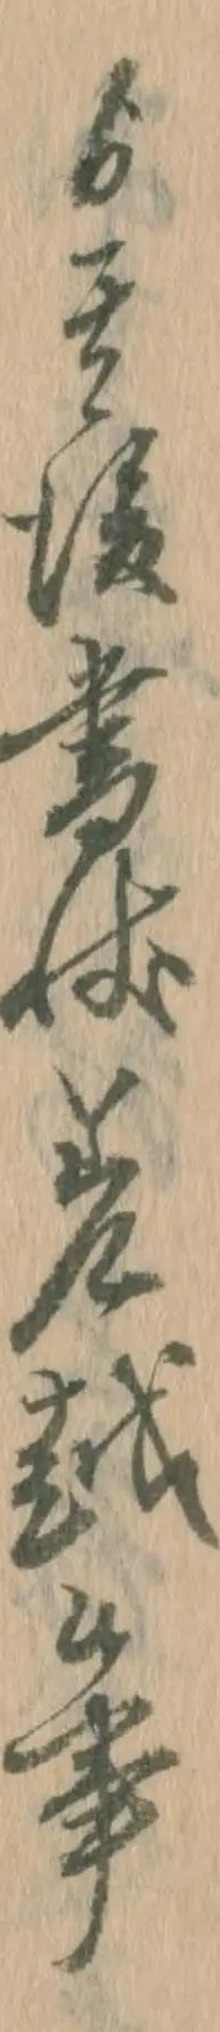ゟ其後書状差越候事
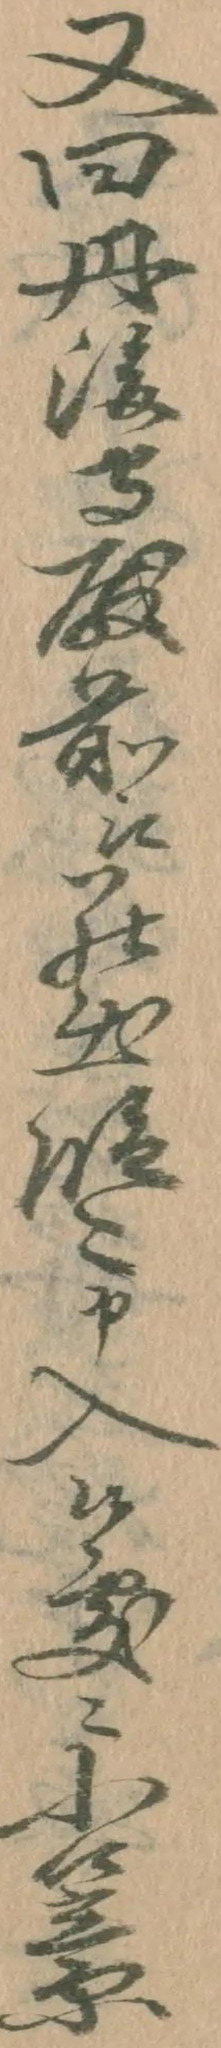又曰丹後守殿前江罷出段々申入候處に小笠原
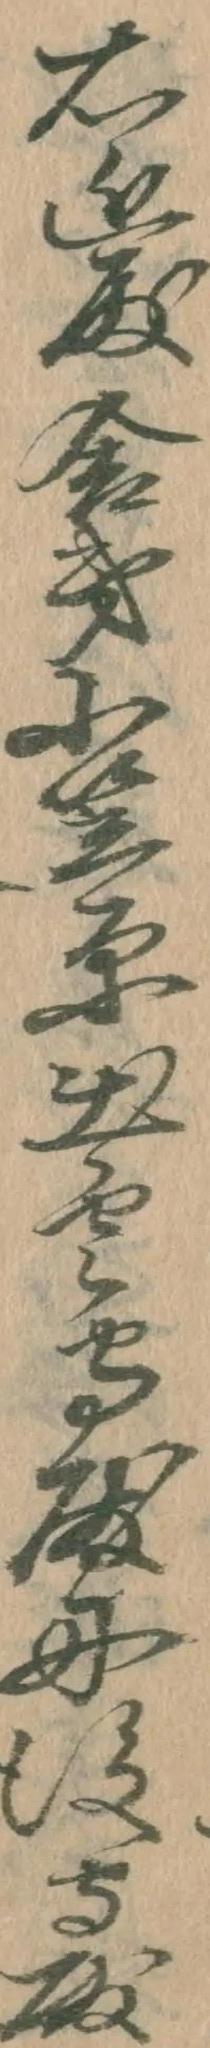右近殿舎弟小笠原出雲守殿丹後守殿
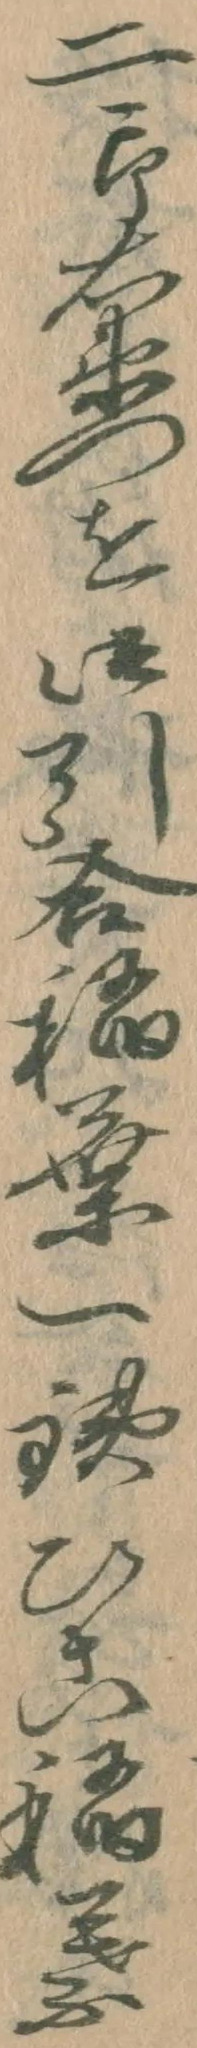二郎右衛門を御引合稲葉一鉄ひ古稲葉
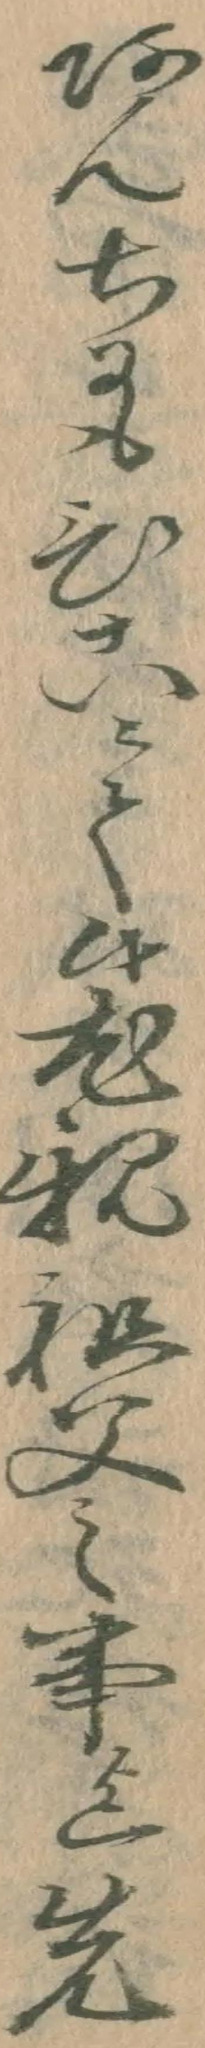阿んち尓も飛古にて候尤親祖父之事迄先
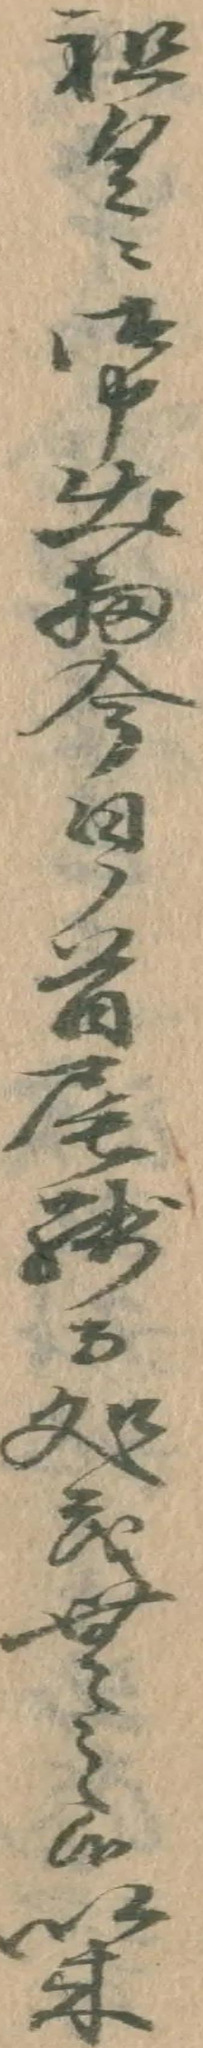祖具に御申出物今日之首尾残る処茂無之候以来
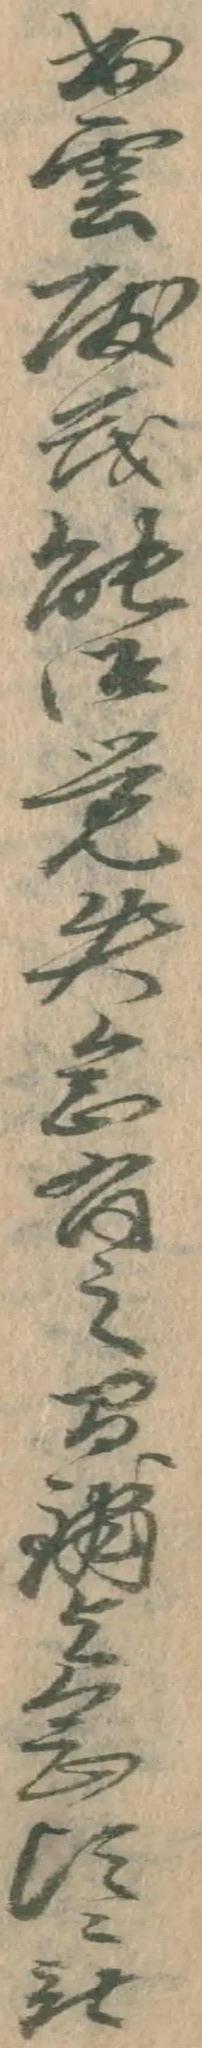出雲殿茂能御覚失念有之間鋪与念頃に被
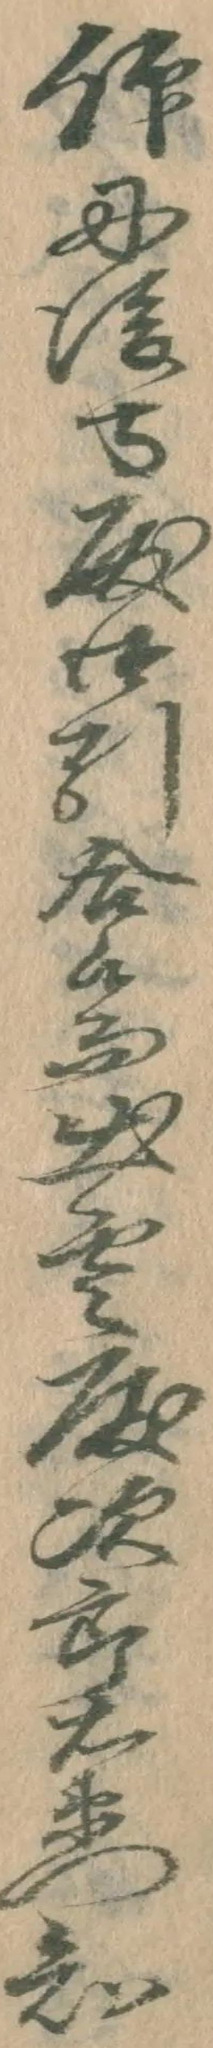仰丹後守殿御引合候而出雲殿次郎右衛門知
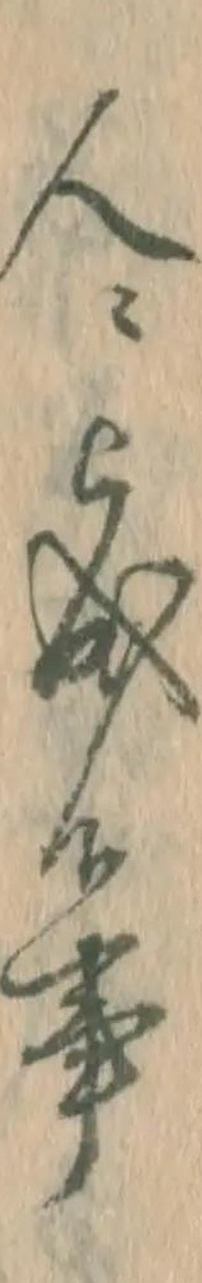人に被成候事
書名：切支丹御退治記 49巻. [8]
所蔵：国立国会図書館 National Diet Library, JAPAN
